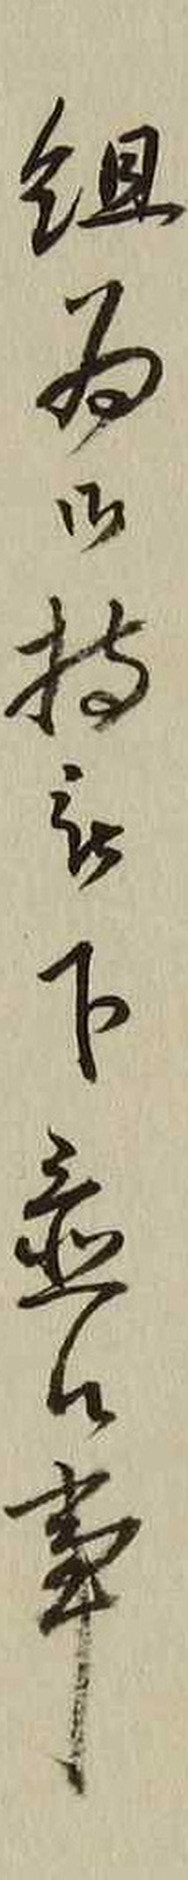組為御持被下置候事
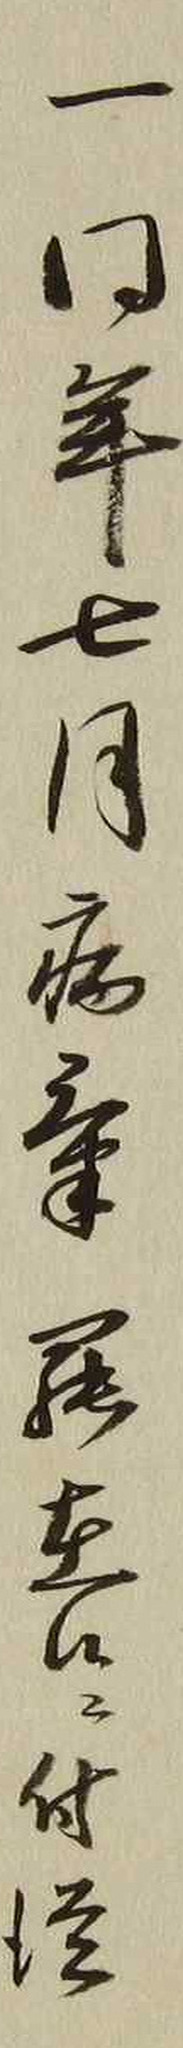一同年七月病気罷在候に付従
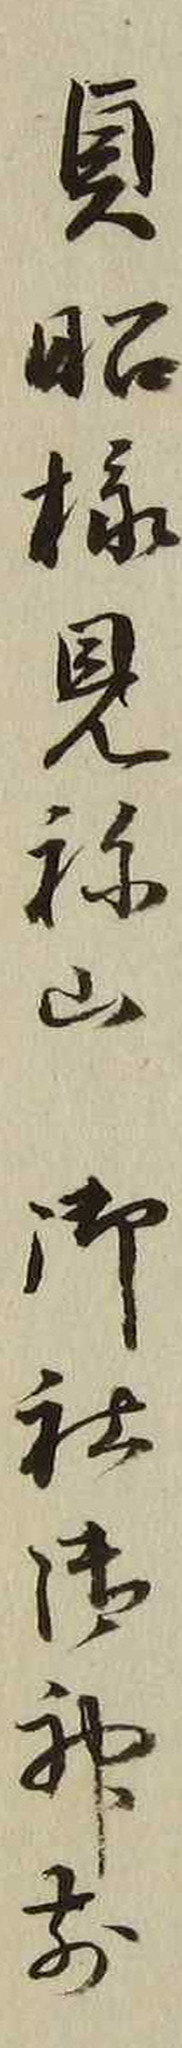貞昭様見祢山御社御神前
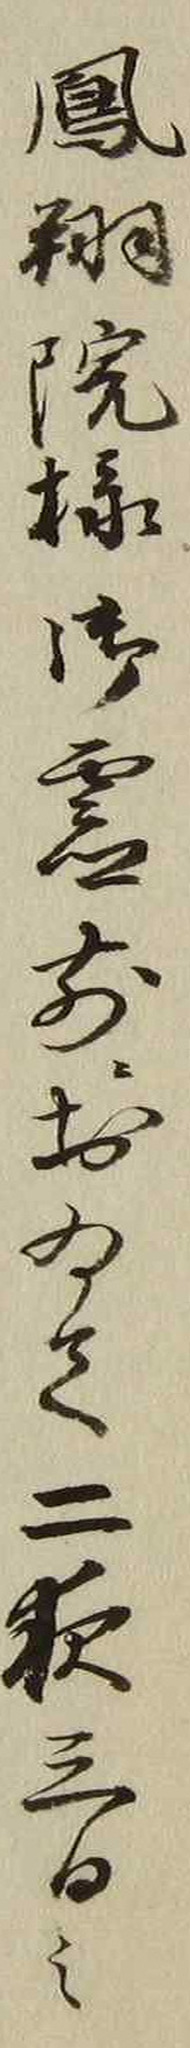鳳翔院様御霊前におゐて二夜三日之
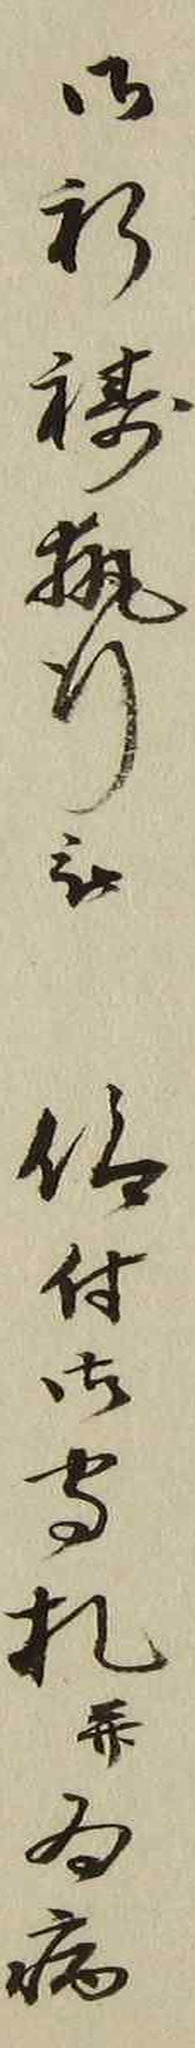御祈祷執行被仰付御守札并為病
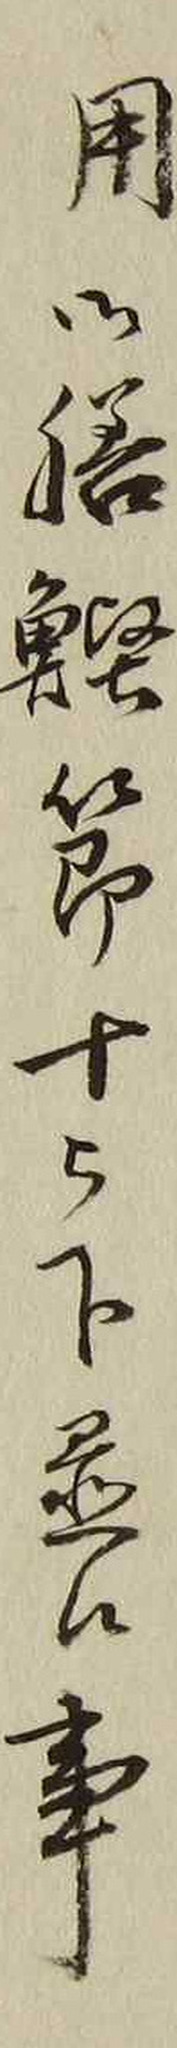用御膳鰹節十被下置候事
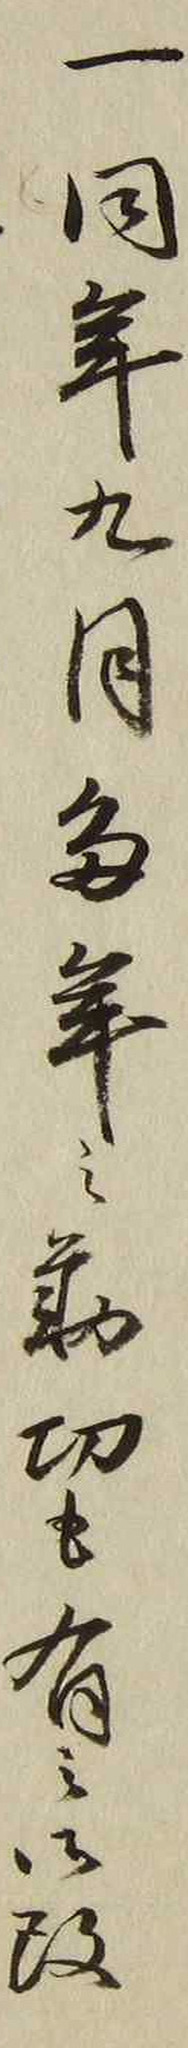一同月九月多年之勤功も有之御改
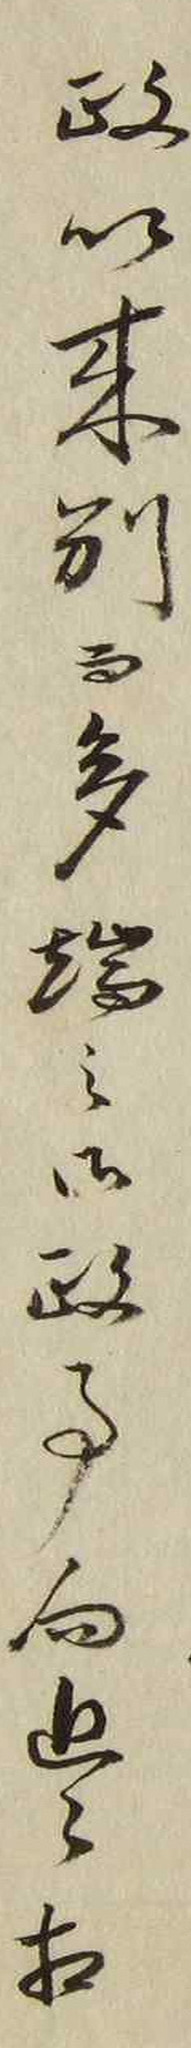政以来別而多端之御政事向追々相
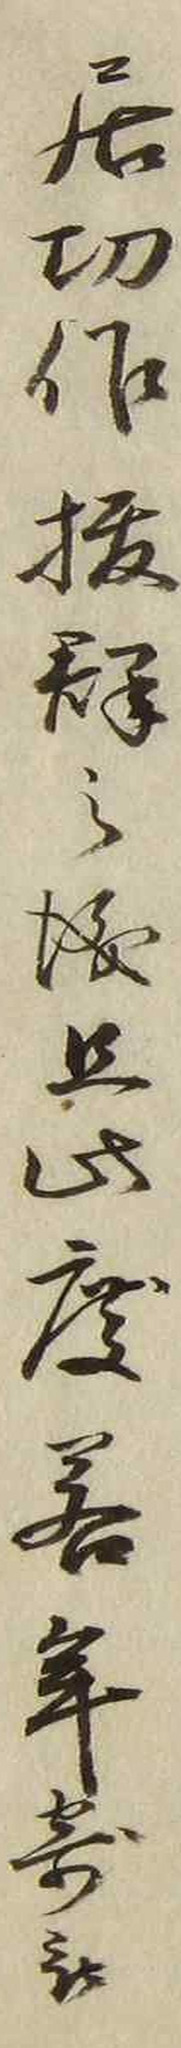居功作抜群之儀且此度若年寄被

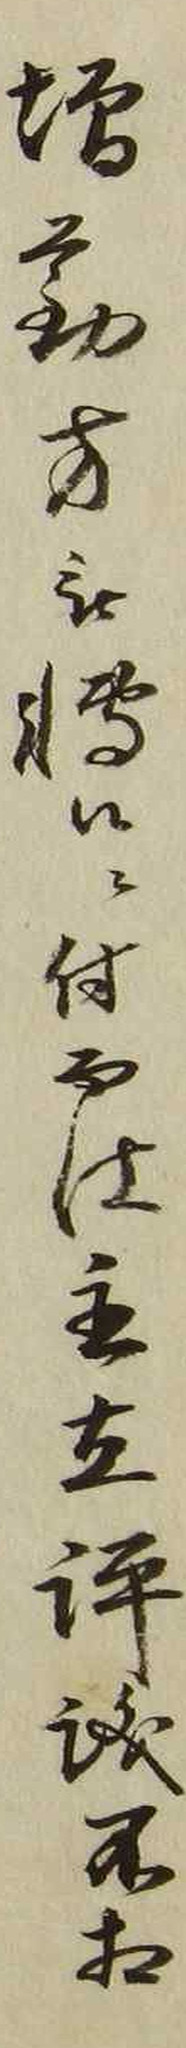増勤方被転候に付而は主立評議不相
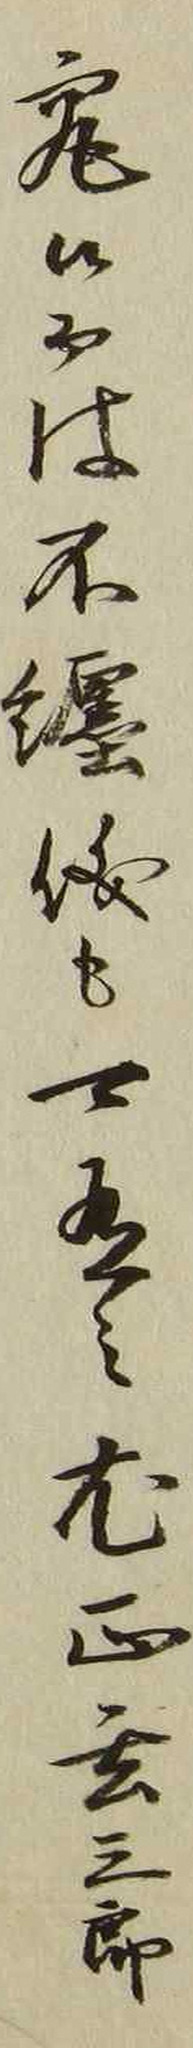究候而は不纏儀も可有之尤正玄三郎
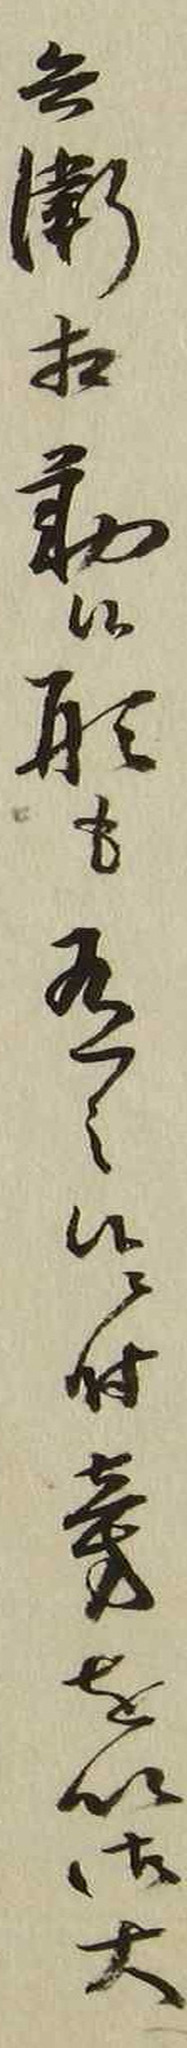兵衛相勤候形も有之候に付旁を以御大
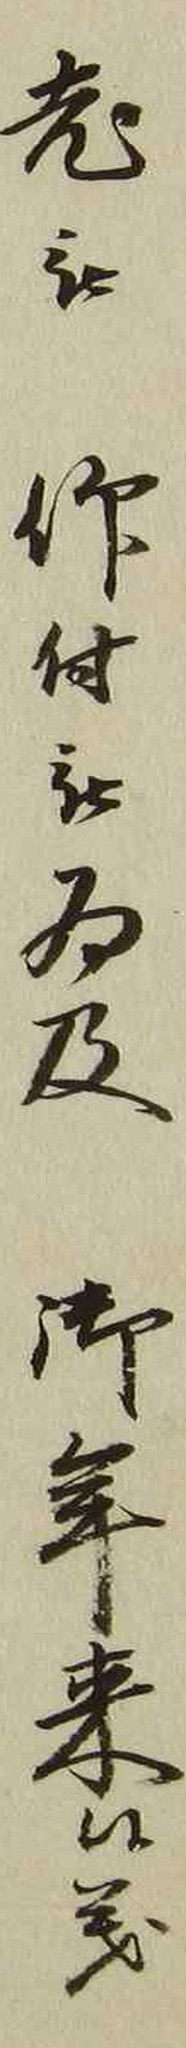老被仰付被為及御年來候義
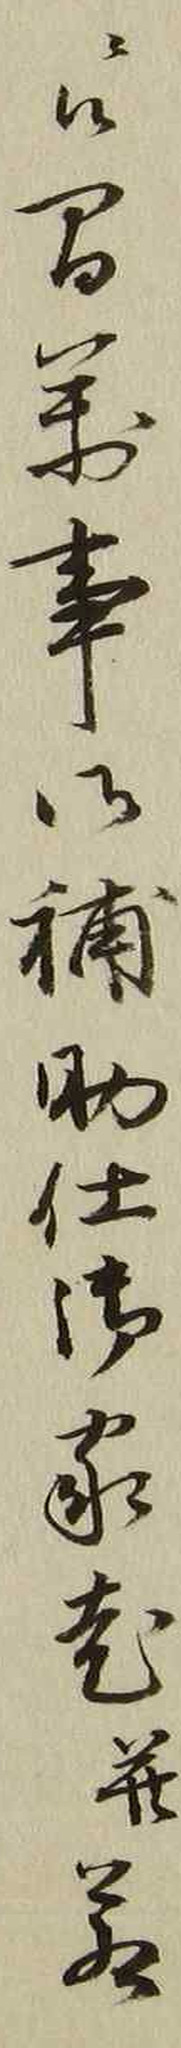に候間萬事御補助仕御家老并若
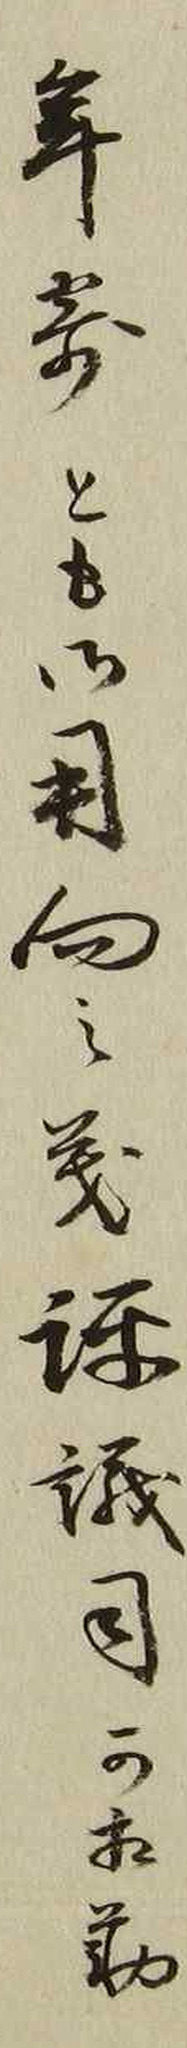年寄とも御用向之義評議司可相勤
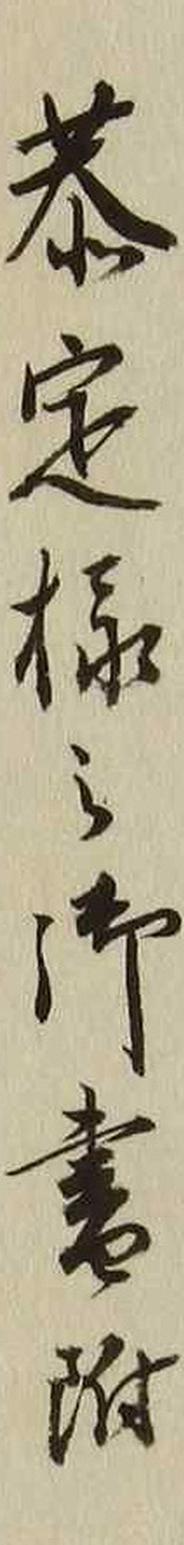恭定様之御書付
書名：諸士系譜　巻之125　た之部1
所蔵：会津若松市立会津図書館
